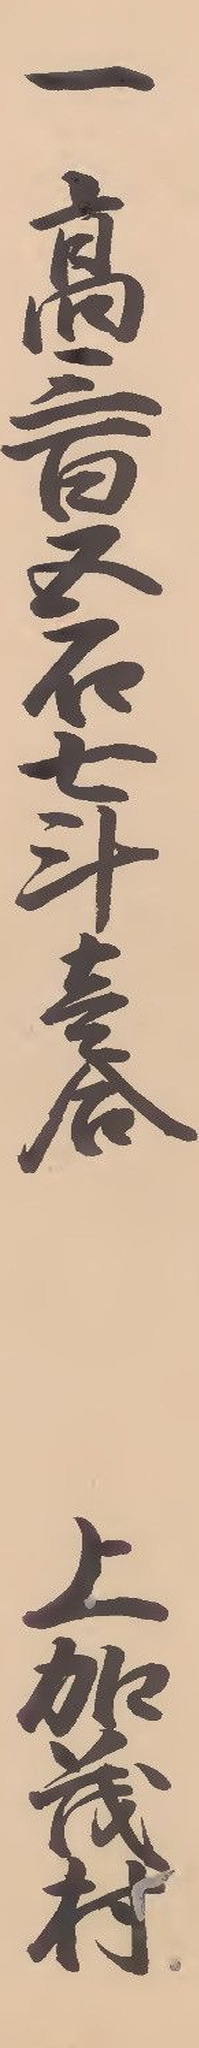一高三百五石七斗壱合上加茂村
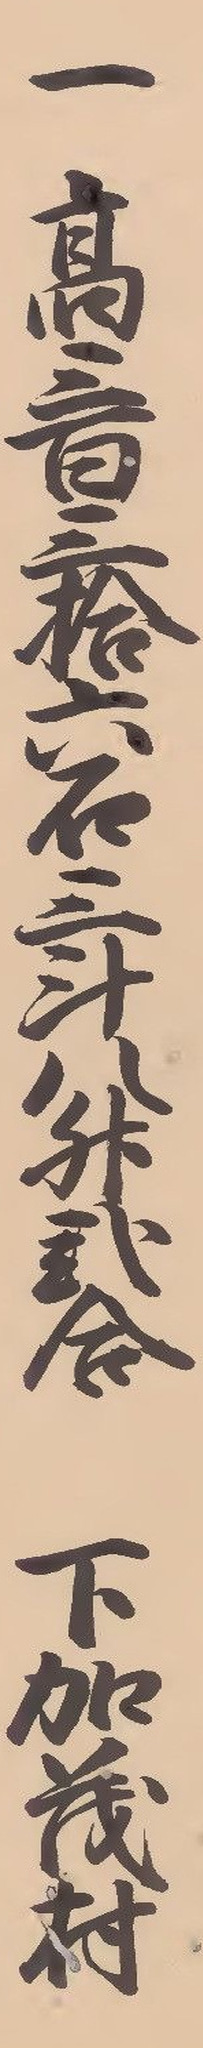一高三百三拾六石三斗八升弐合下加茂村
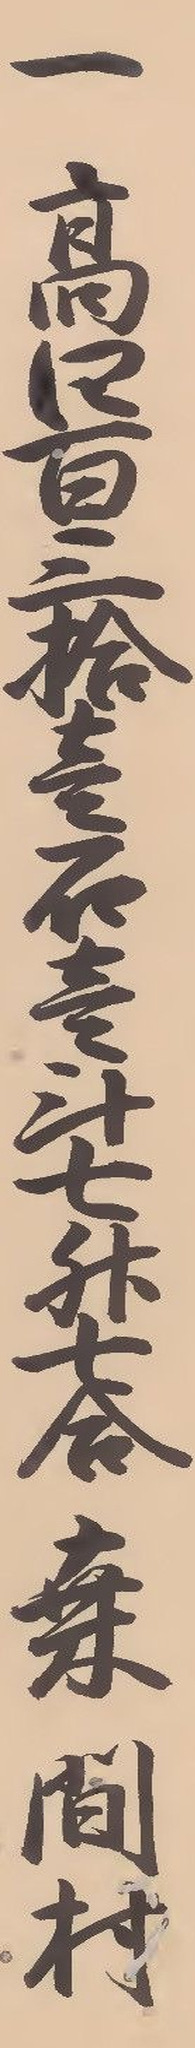一高四百三拾壱石壱斗七升七合桑間村
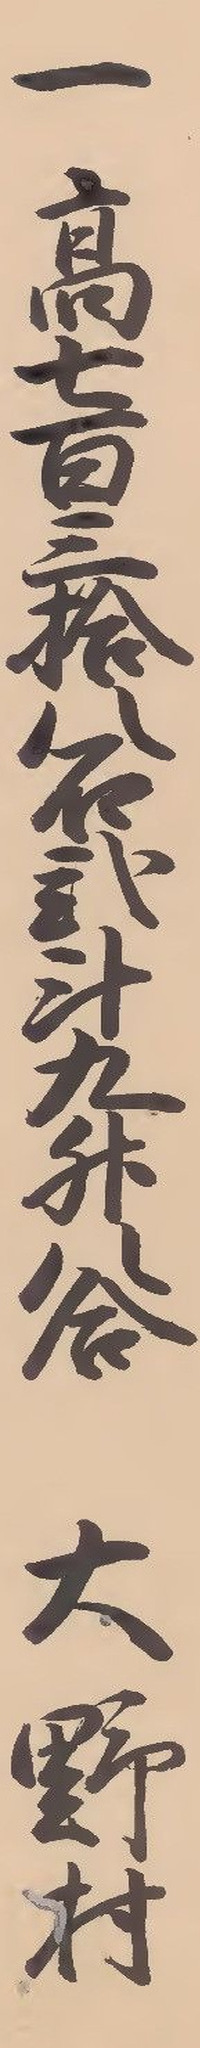一高七百三拾八石弐斗九升八合大野村
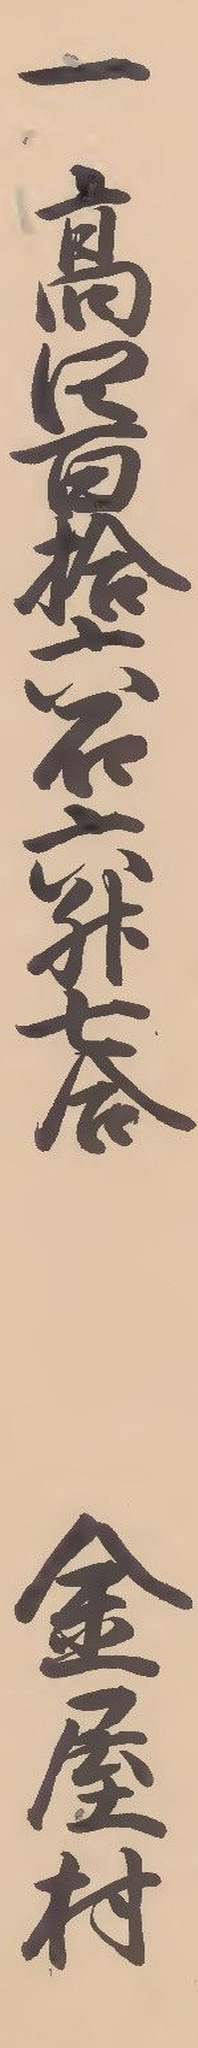一高四百拾六石六升七合金屋村
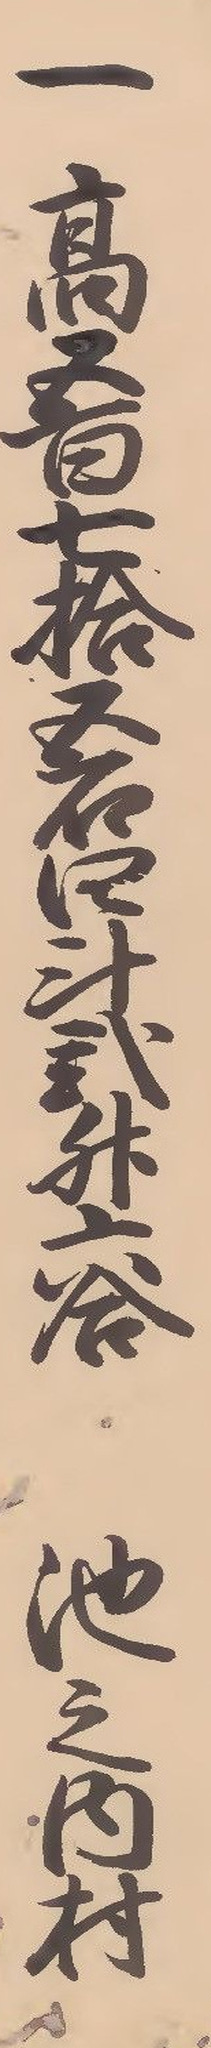一高五百七拾五石四斗弐升六合池之内村

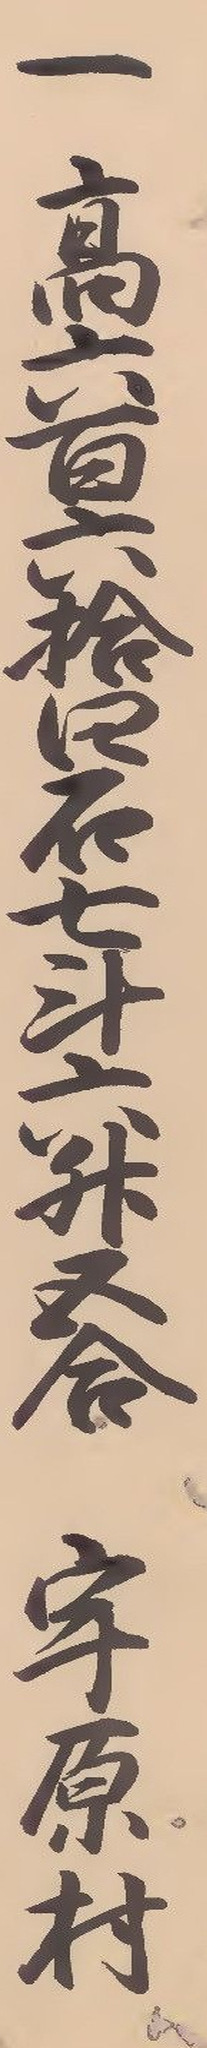一高六百六拾四石七斗六升五合宇原村
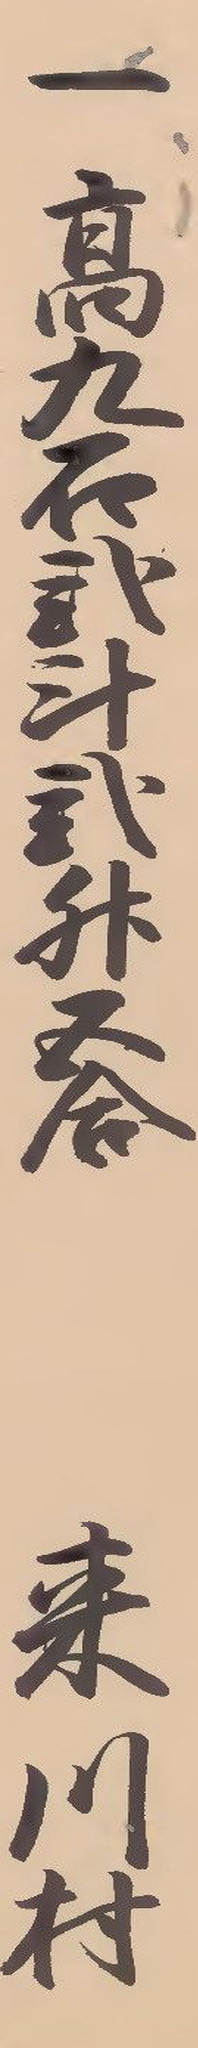一高九石弐斗弐升五合来川村
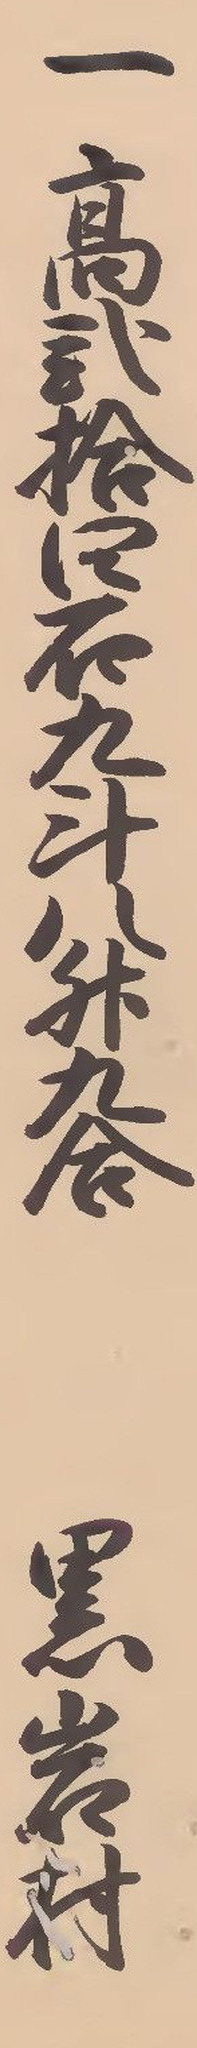一高弐拾四石九斗八升九合黒岩村
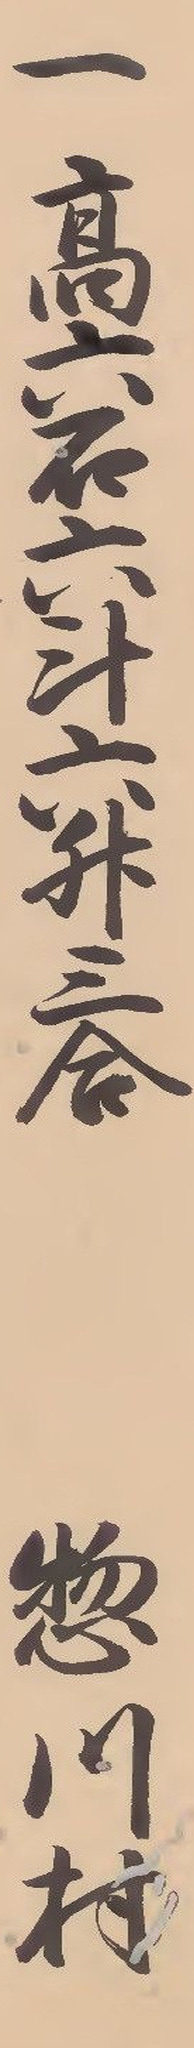一高六石六斗六升三合惣川村
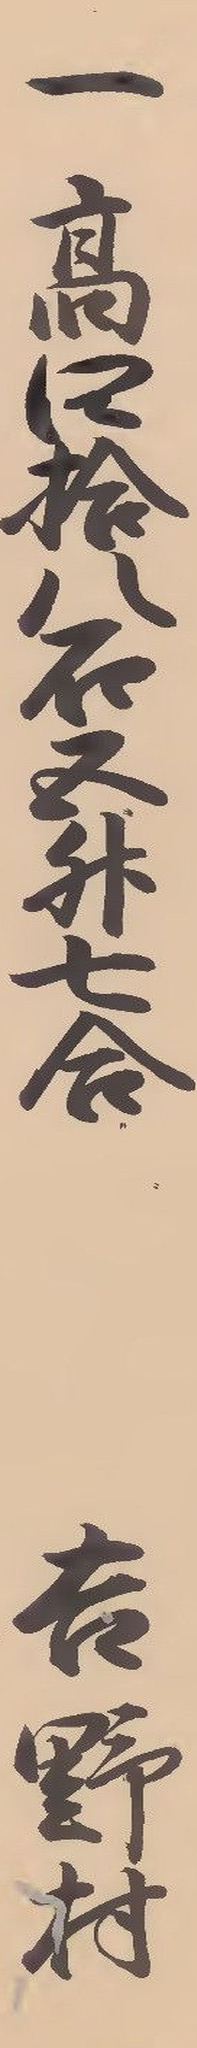一高四拾八石五升七合吉野村
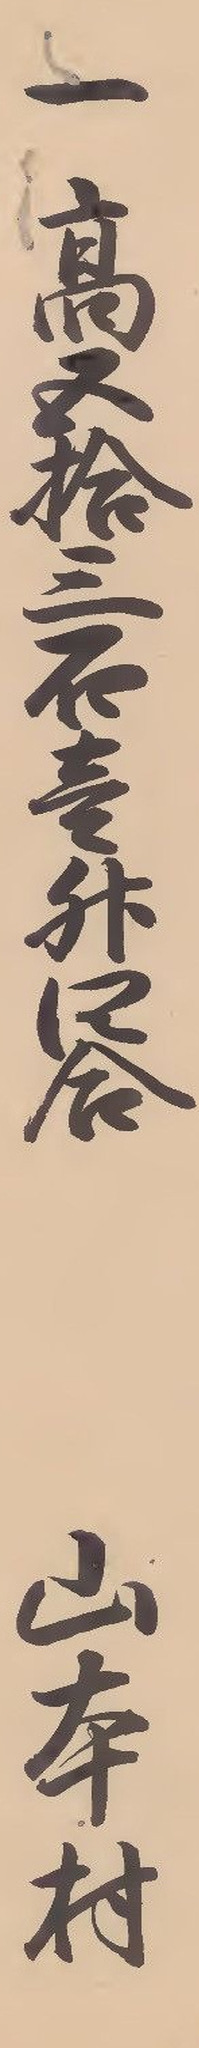一高五拾三石壱升四合山本村
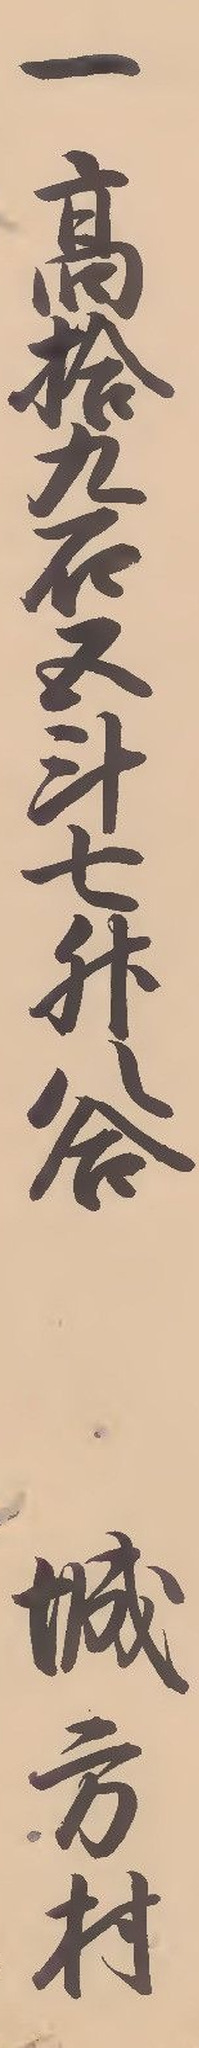一高拾九石五斗七升八合城方村

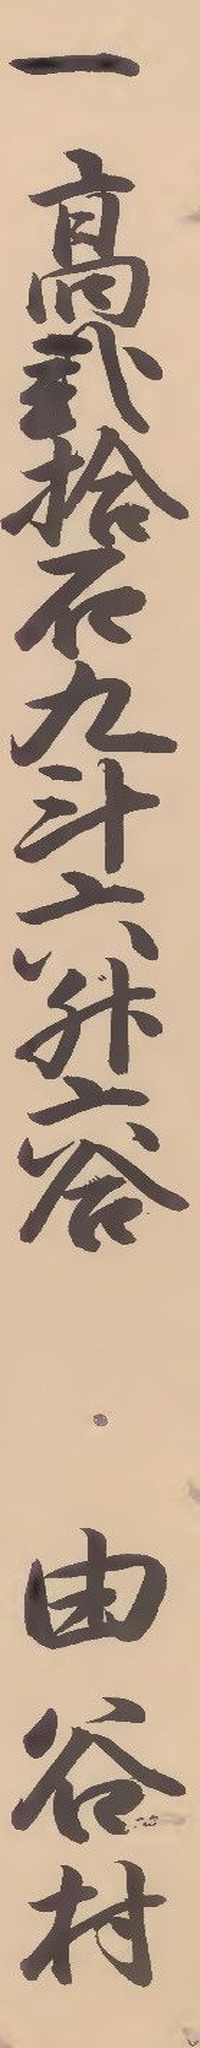一高弐拾石九斗六升六合由谷村
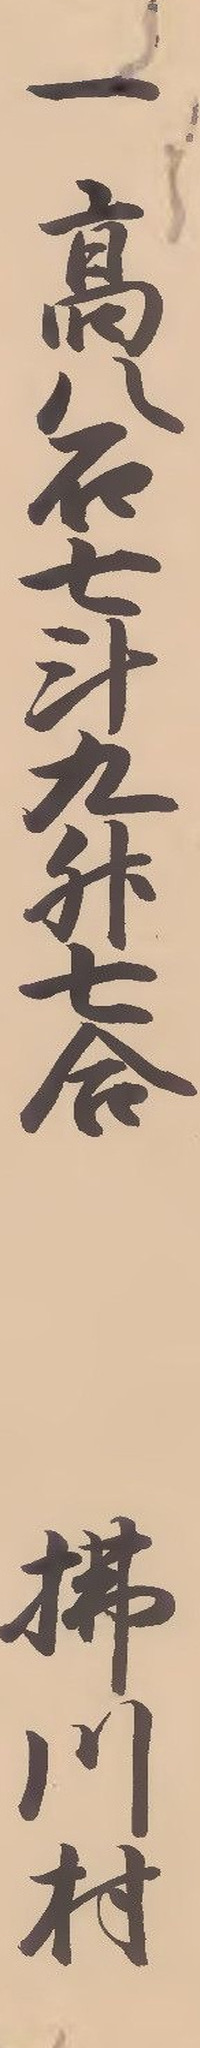一高八石七斗九升七合払川村
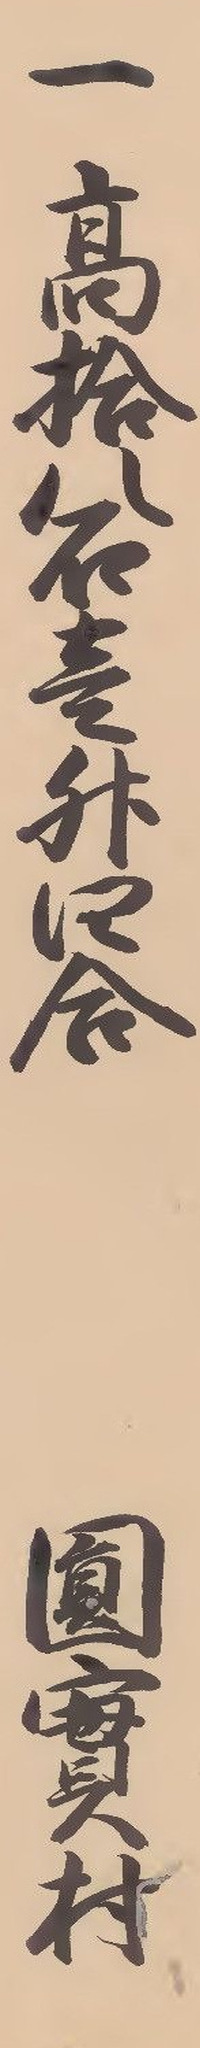一高拾八石壱升四合円実村
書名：淡路国郷帳
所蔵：国立公文書館 National Archives of Japan
